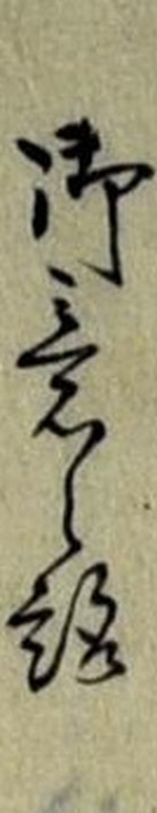御意之趣
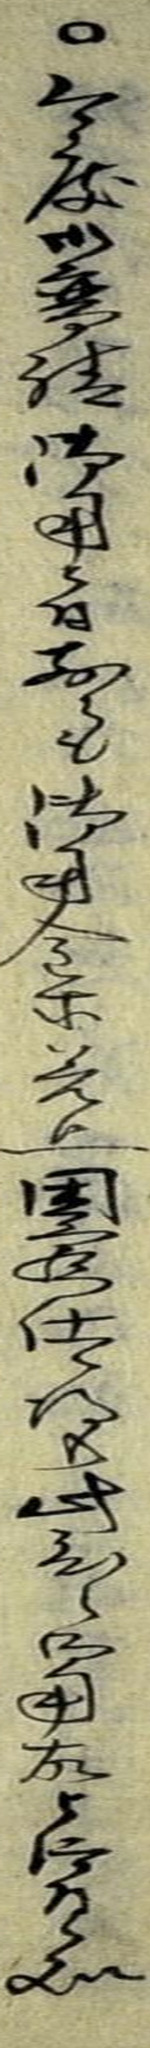〇今度御普請御用ニ付前々も御用金等差上困窮仕候得共此度之御用故被仰付候処
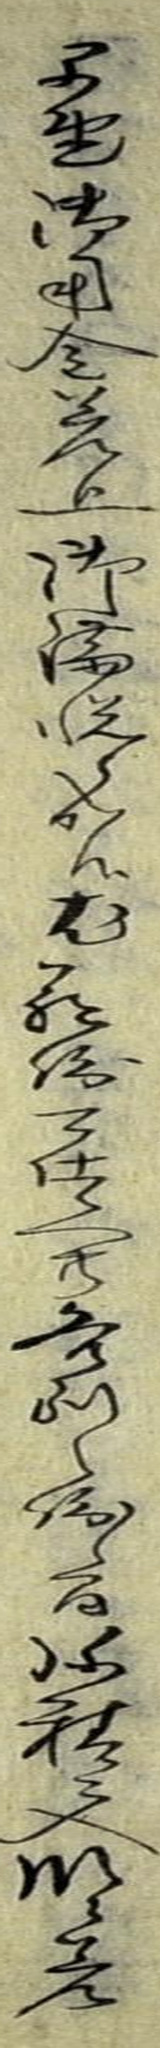早速御用金差上御満悦被成候尤難儀可仕候へ共各別之儀候間弥精ニ入段々差
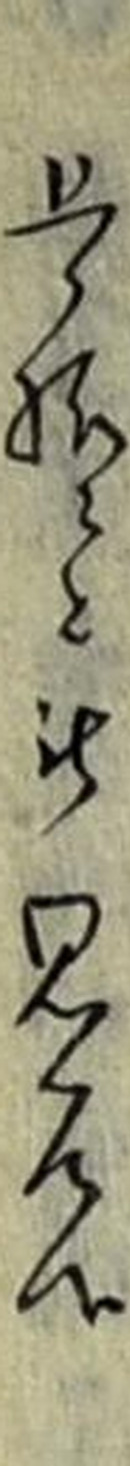上候様ニと被思召候
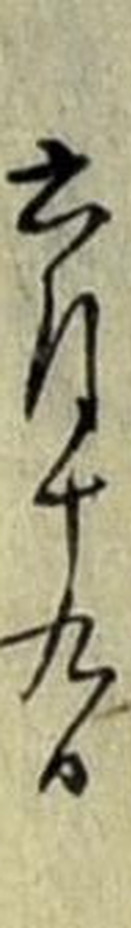六月十九日
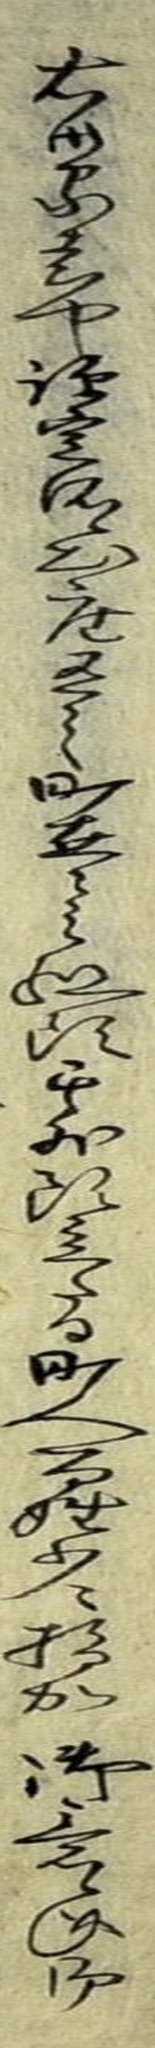右御家老中評定所へ出座有之町在々之組頭其外頭立たる町人百姓少々指加御意之趣御
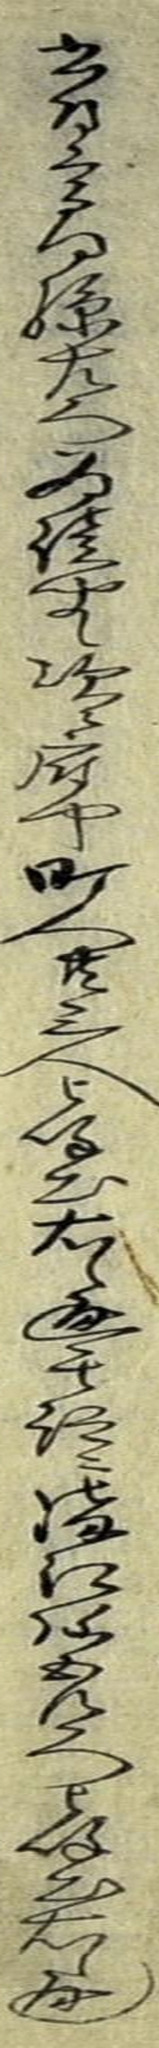書付高田孫左衛門為読聞候次ニ府中町人共三人被呼出右之通其跡ニ溝口弥五左衛門被呼出右之通
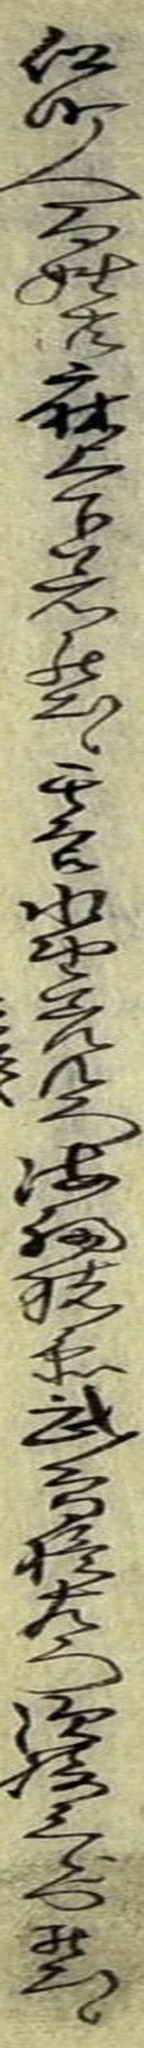但町人百姓共麻上下着罷出候其節水野善左衛門海福猪兵衛武曽権左衛門須崎三郎右衛門罷出候
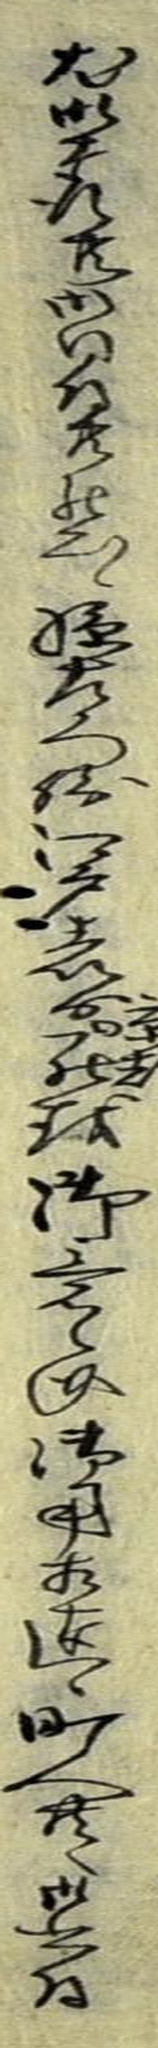尤御奉行共御目付共罷出候孫左衛門儀江戸表ゟ◦京都へ罷越御意之趣御用相達候町人共へ御書付
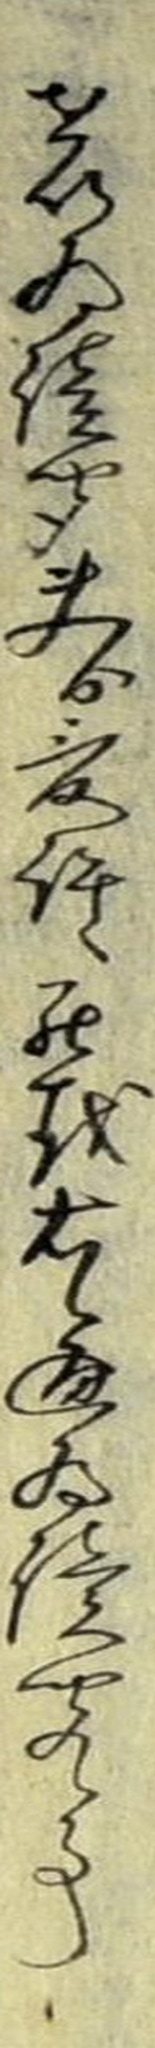を以為読聞夫ゟ爰許へ罷越右之通被読聞候事

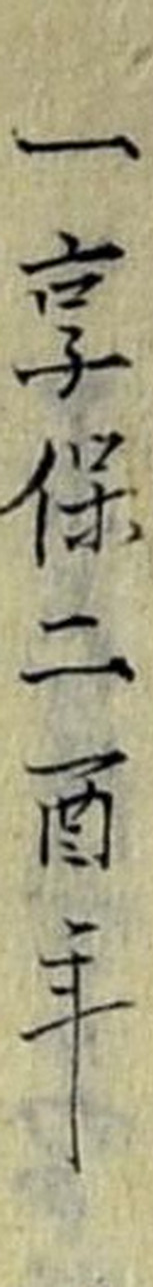一享保二酉年
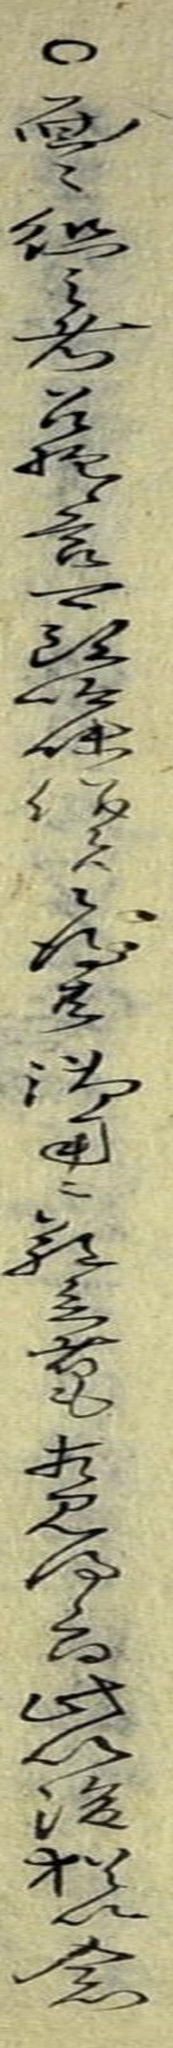〇面々組之者召抱候節可致吟味儀ニハ候得共御用ニ難立者も相見得候間此以後猶以念
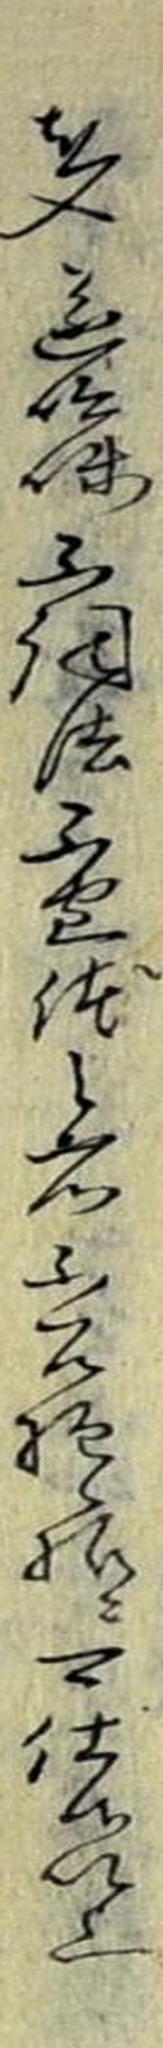を入遂吟味不調法不宜体之者不召抱候様ニ可仕候以上
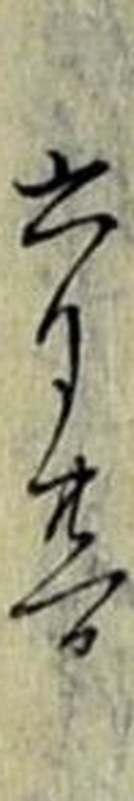六月廿一日
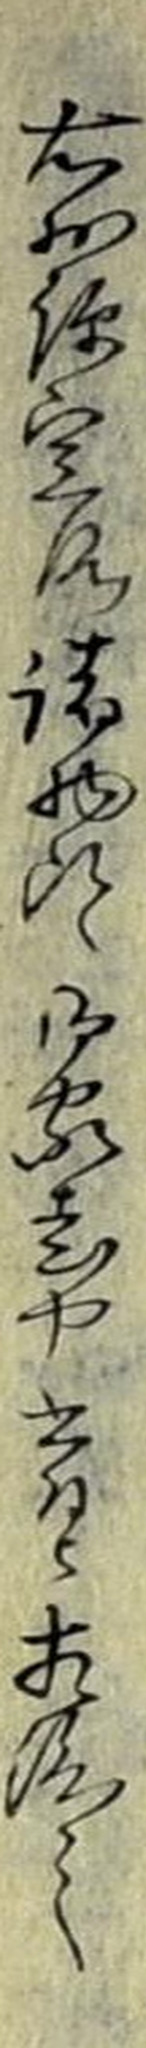右於評定所諸物頭へ御家老中書付被相渡之
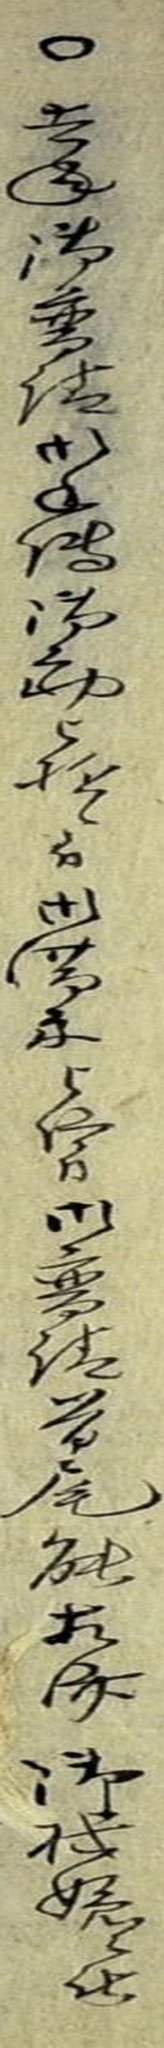〇去年御普請御手伝御勤被遊候ニ付御借米被仰付御普請首尾能相済御機嫌ニ被
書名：命令之部 一
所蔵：福井県文書館 Fukui Prefectural Archives
